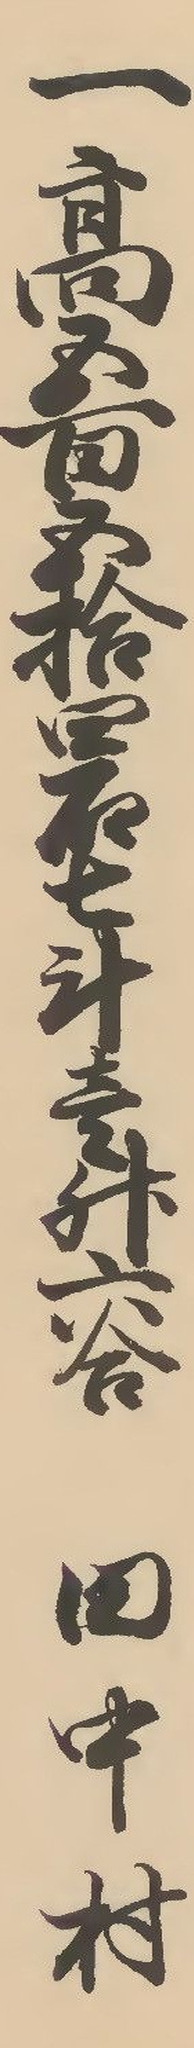一髙五百五拾四石七斗壱升六合田中村

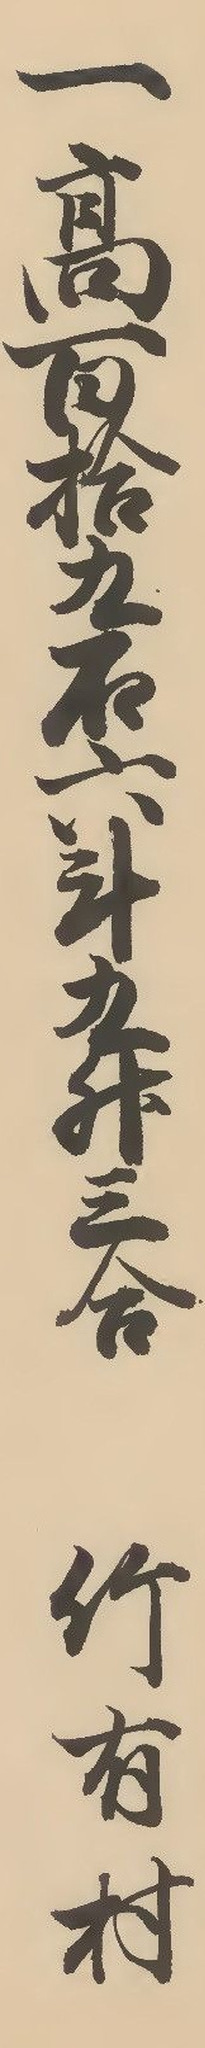一髙百拾九石六斗九升三合竹有村
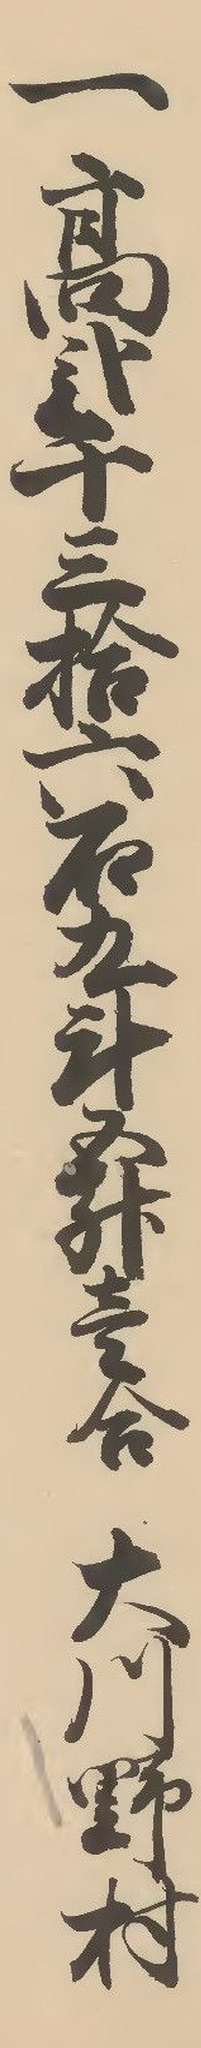一髙弐千三拾六石九斗五升壱合大川野村
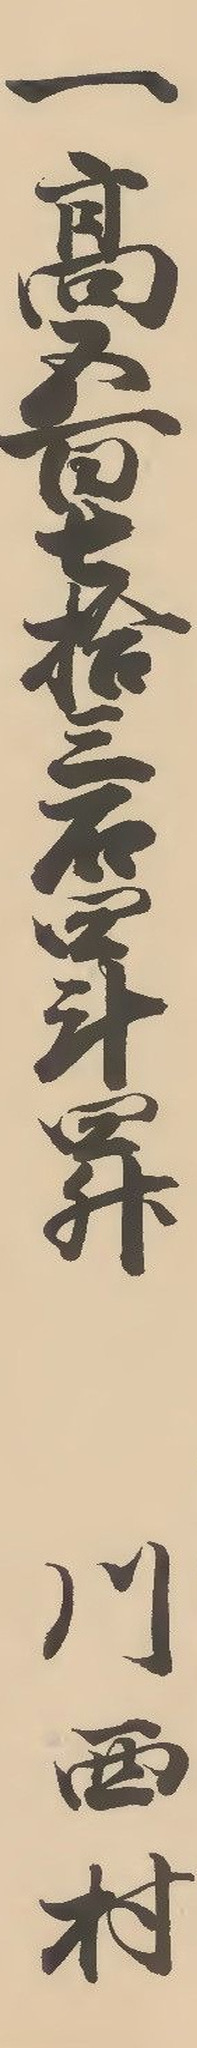一髙五百七拾三石四斗四升川西村
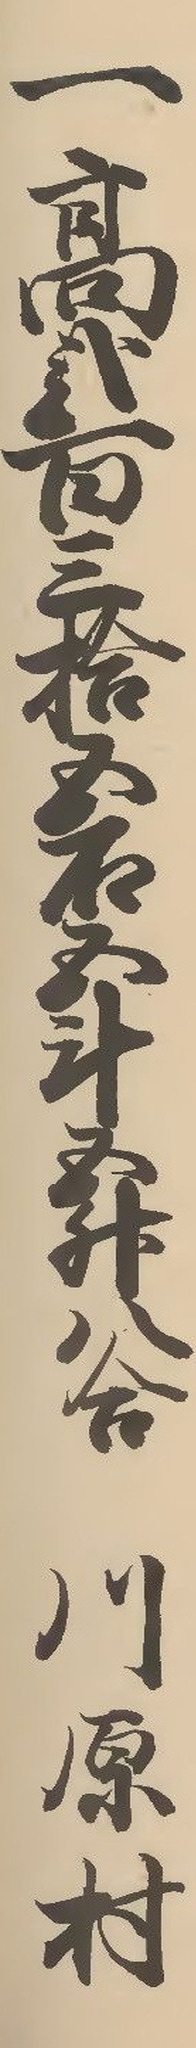一髙弐百三拾五石五斗五升八合川原村
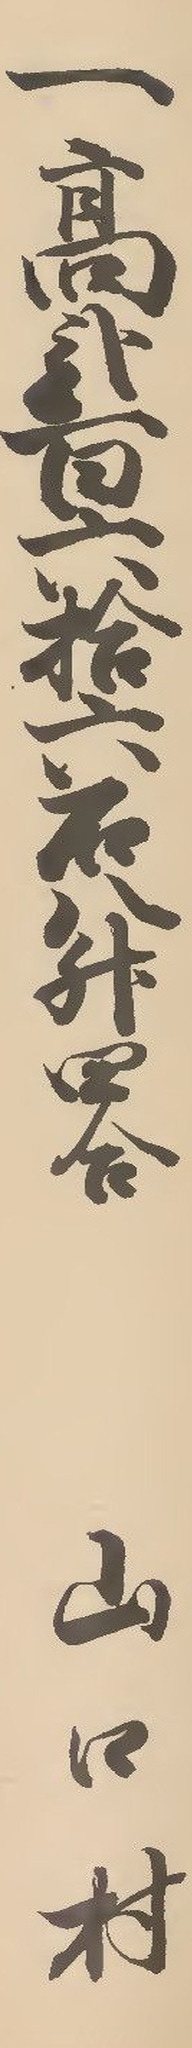一髙弐百六拾六石八升四合山口村
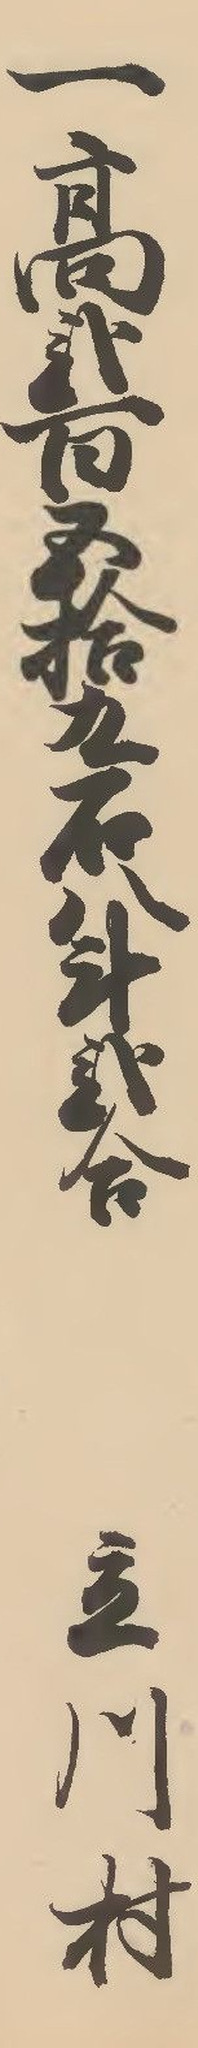一髙弐百五拾九石八斗弐合立川村
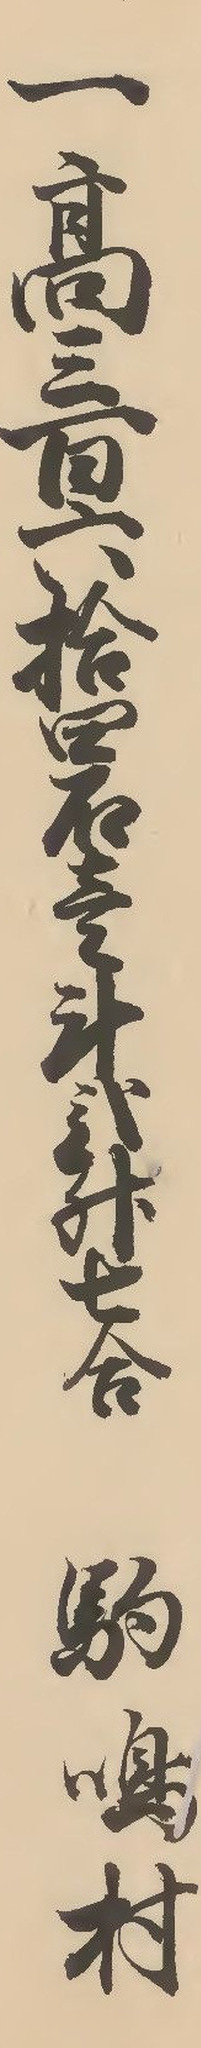一髙三百六拾四石壱斗弐升七合駒鳴村
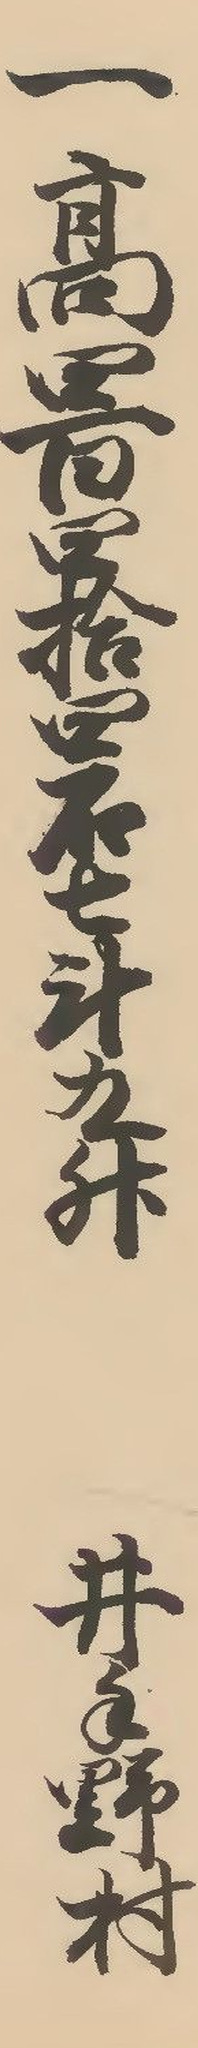一髙四百四拾四石七斗九升井手野村

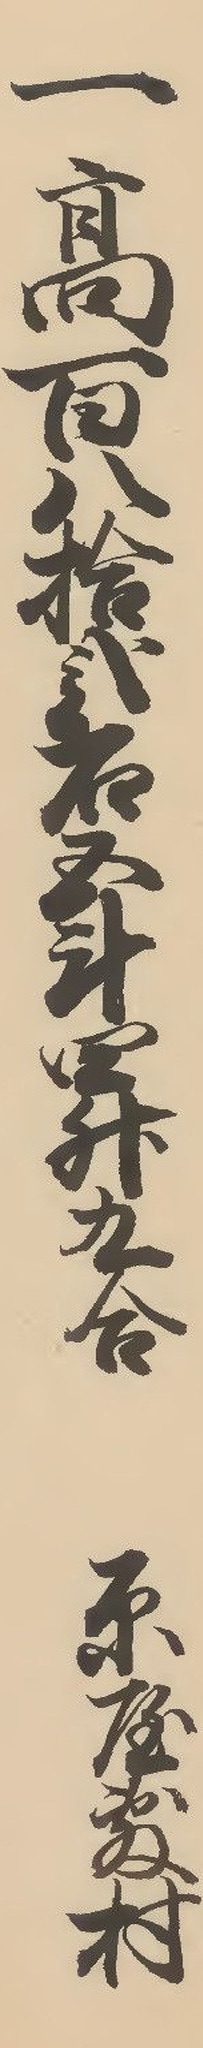一髙百八拾弐石五斗四升九合原屋敷村
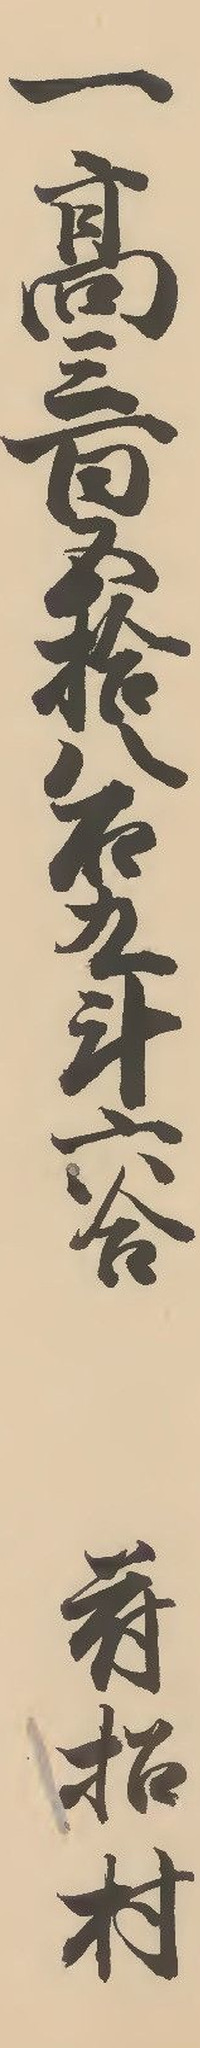一髙三百五拾八石九斗六合府招村
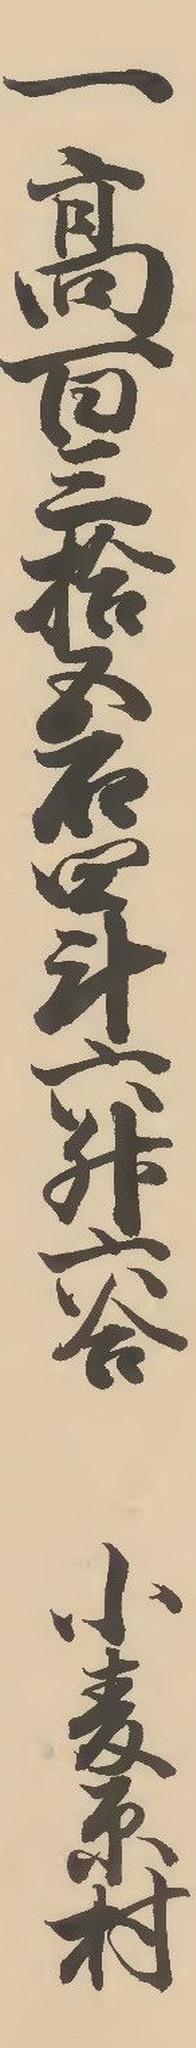一髙百三拾五石四斗六升六合小麦原村
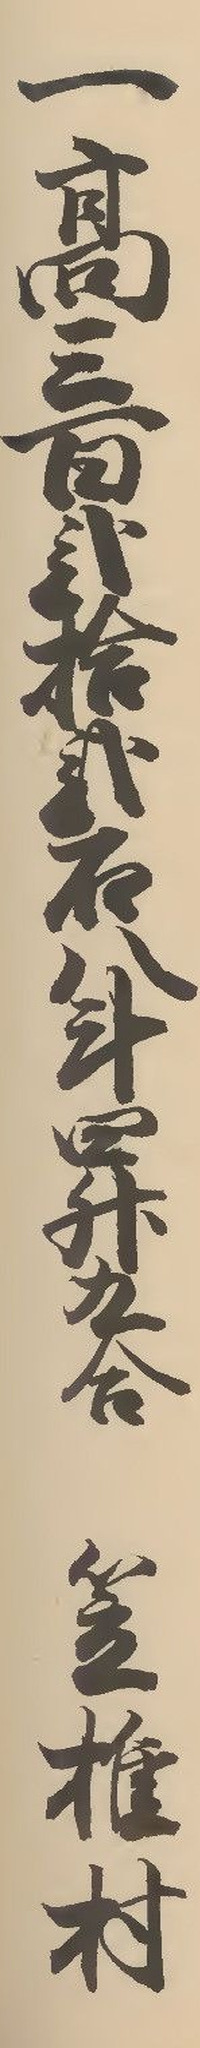一髙三百弐拾弐石八斗四升九合笠椎村
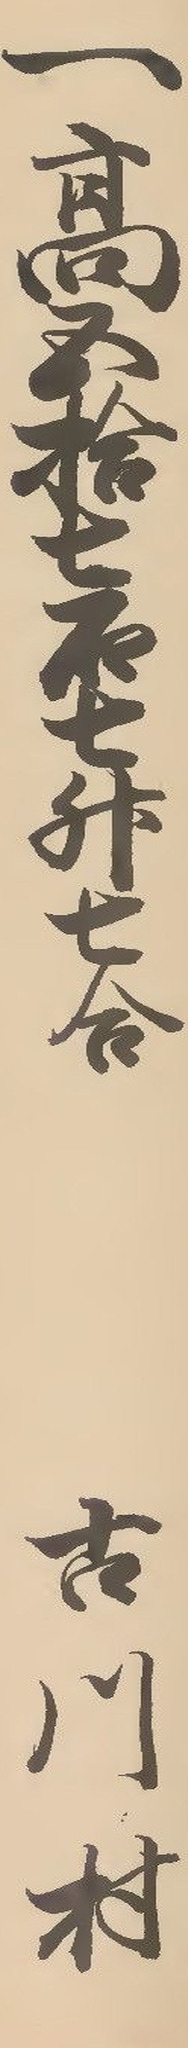一髙五拾七石七升七合古川村
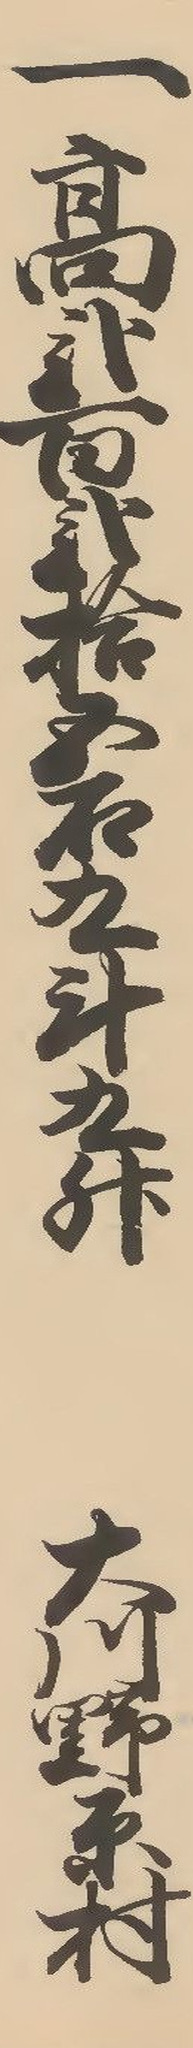一髙弐百弐拾五石九斗九升大川野原村
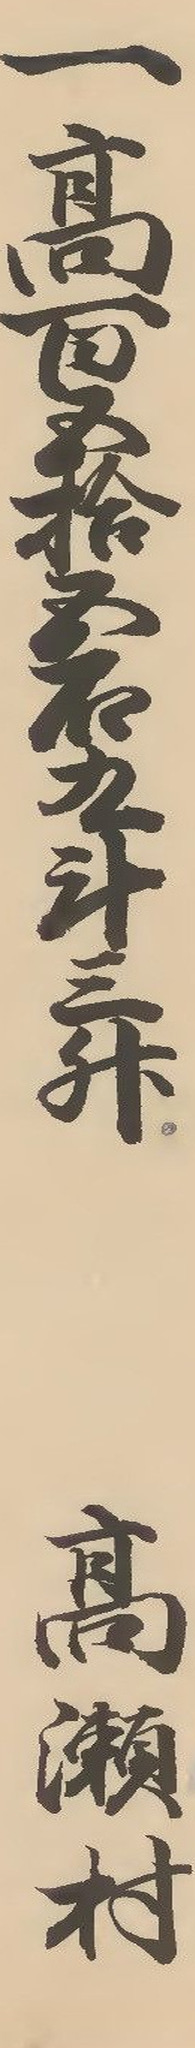一髙百五拾五石九斗三升高瀬村
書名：肥前国郷帳
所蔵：国立公文書館 National Archives of Japan
